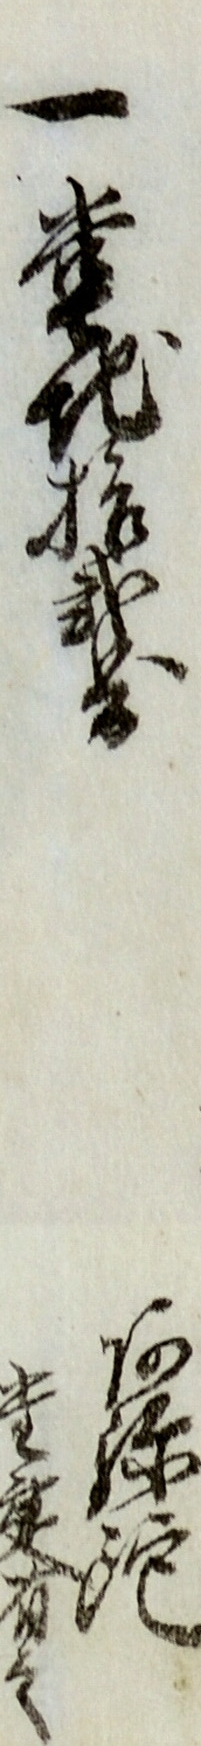一堂地拾弐歩阿弥陀

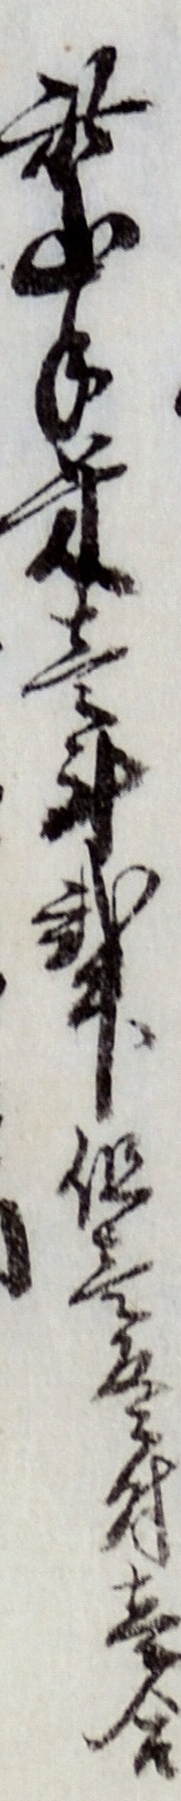此山手米三斗六升但壱反ニ付壱合
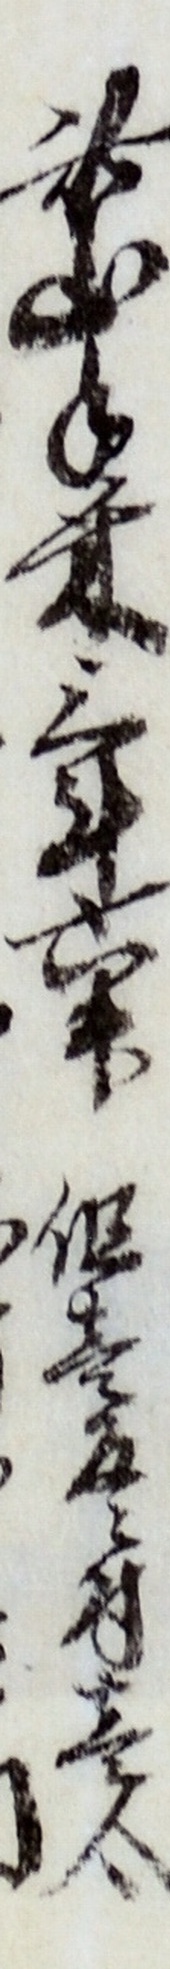此山手米三斗六升但壱反ニ付壱合
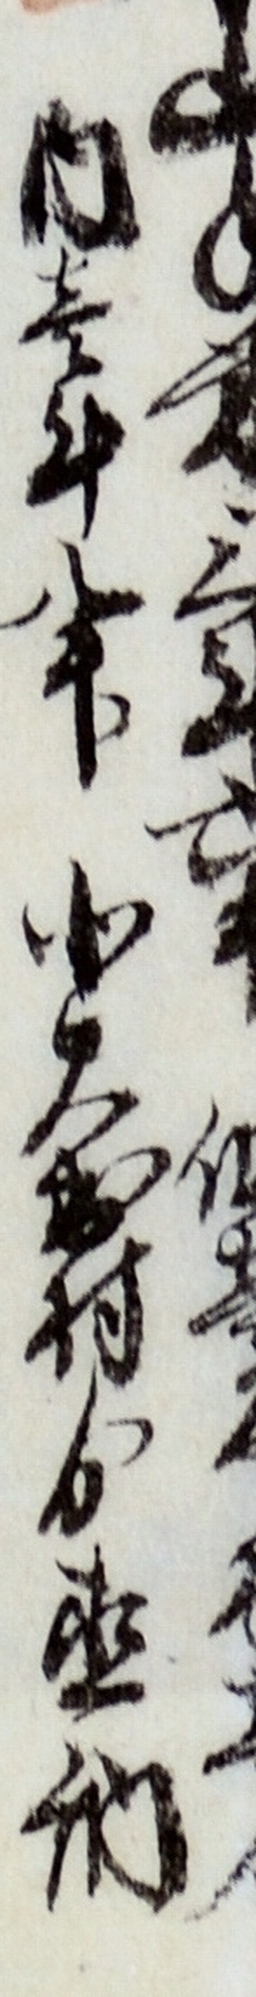☐内壱斗八升北大出村より直納
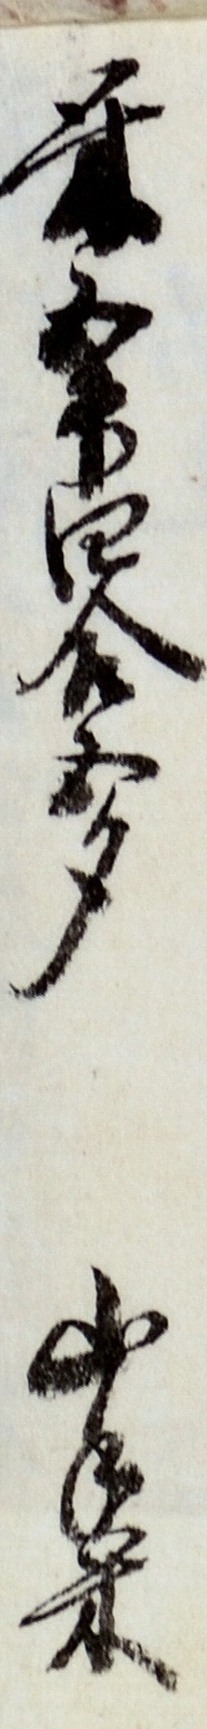米五升四合五勺山手米
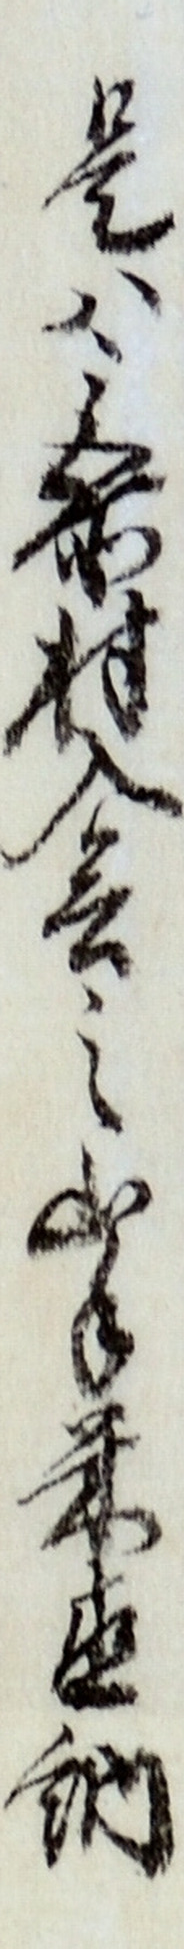是ハ宮所村入会之山手米直納

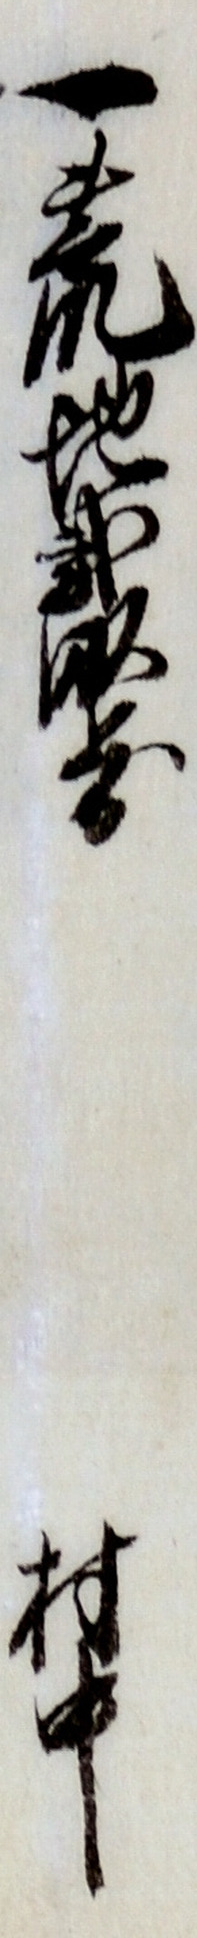一荒地弐畝歩村中
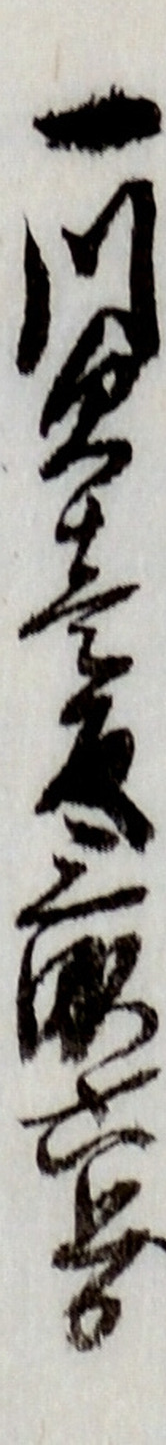一川欠壱反三畝六歩同断
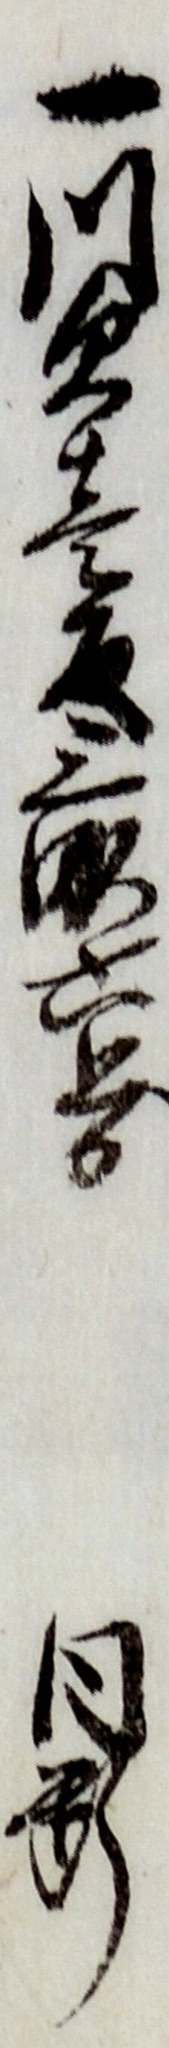一川欠壱反三畝六歩同断
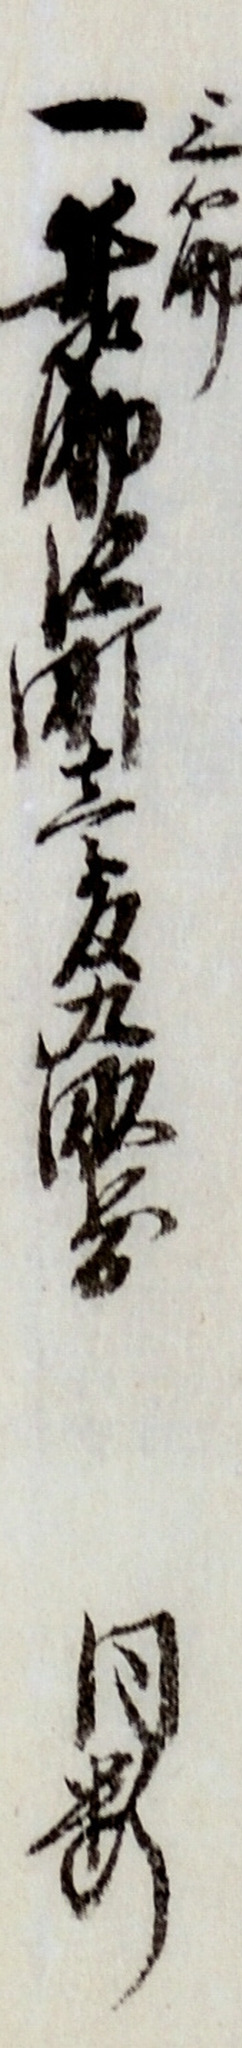一井筋四町壱反九畝歩同断
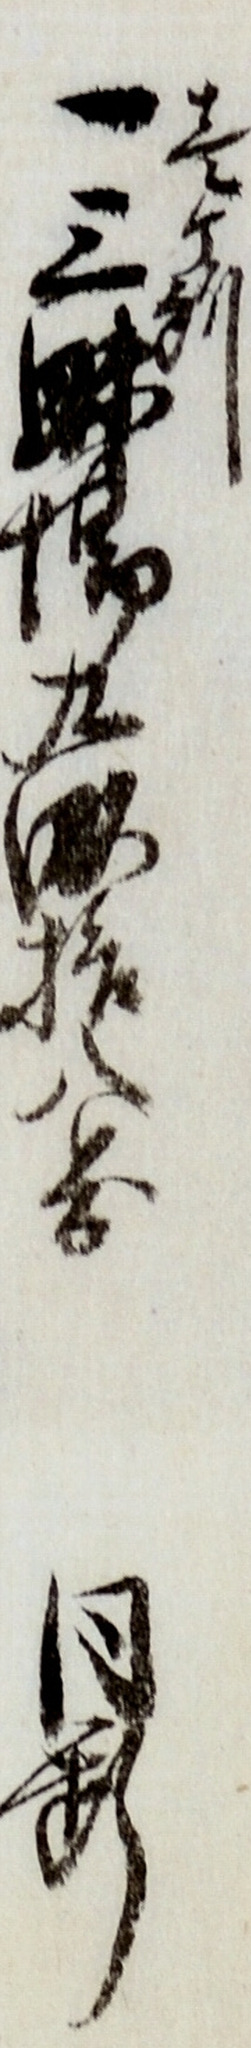一三昧場九畝拾八歩同断
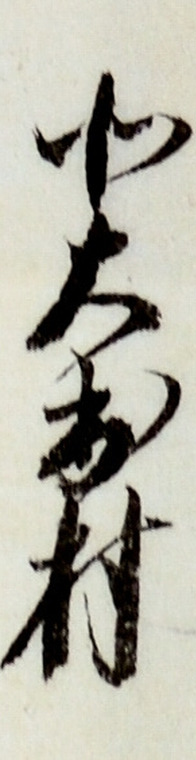北大出村
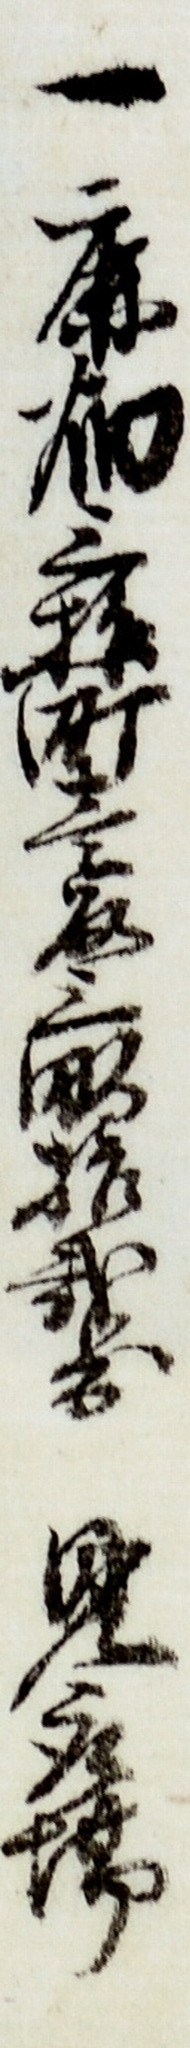一麻畑三拾町壱反三畝拾弐歩見取場
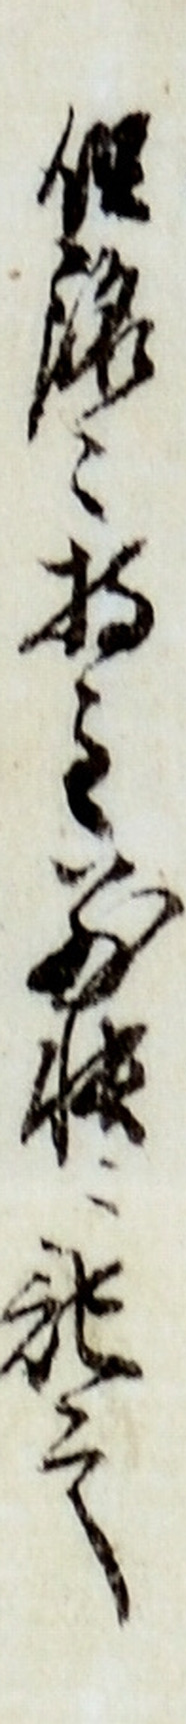但銘々持主別帳ニ記之
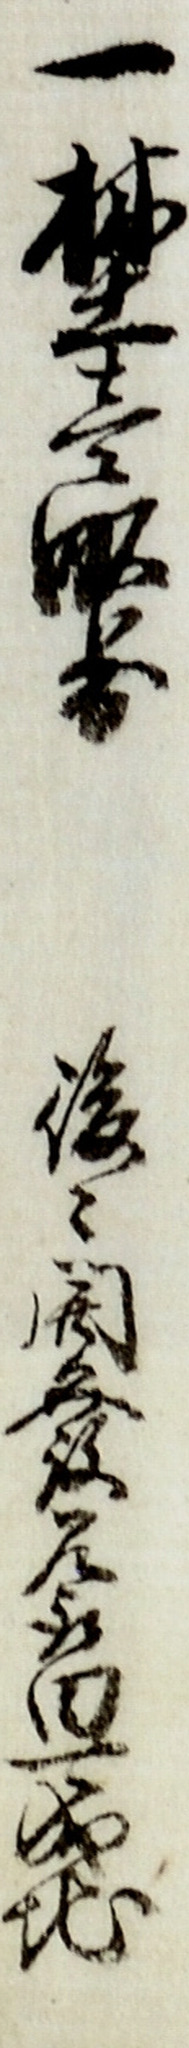一林土壱畝歩後々開発見取田可成地
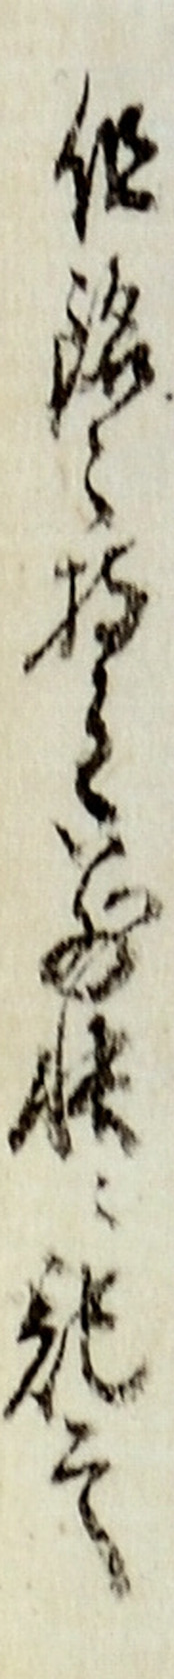但銘々持主別帳ニ記之
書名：御領分中山林社地手控
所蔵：伊那市立高遠町図書館・合同会社AMANE
